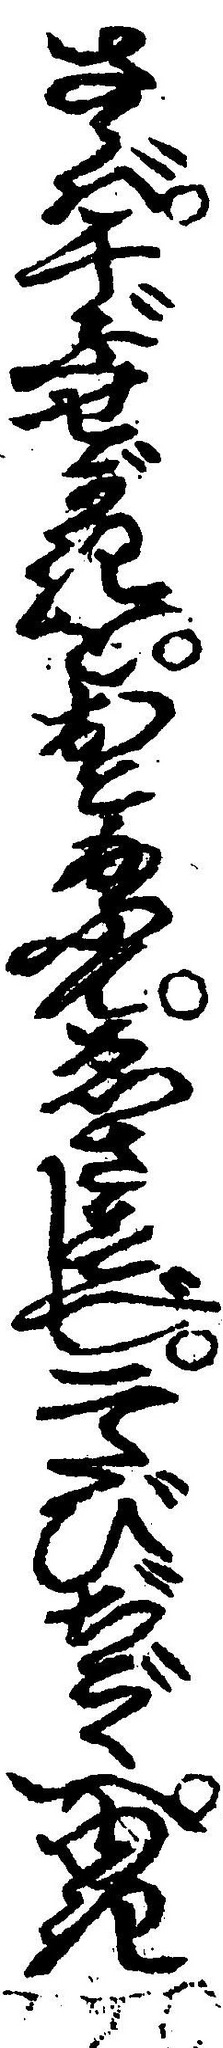さらば。千ぶせがきを。おこなふて。ゑさすべし。二たびぢごくへ。ゆき
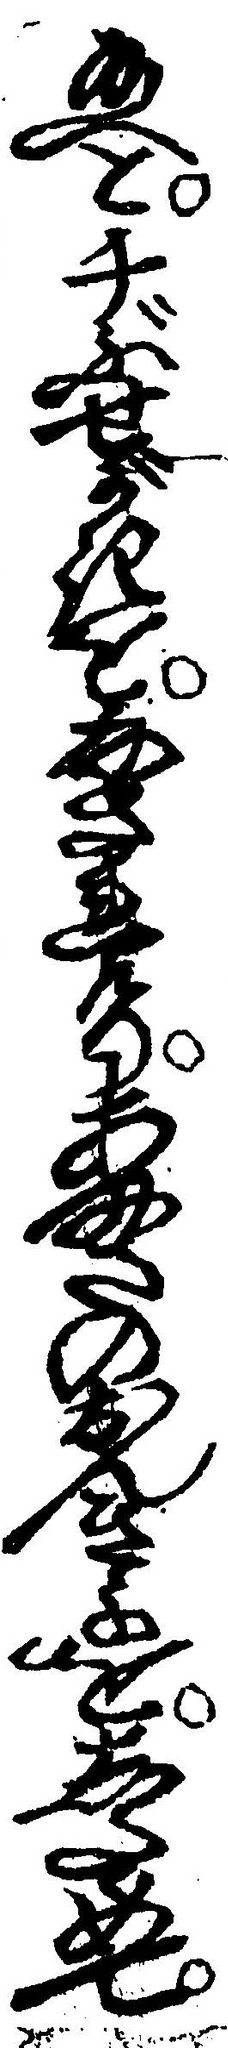給へと。千ぶせがきを。なされけり。あまたのおんきょを。したゝめて。
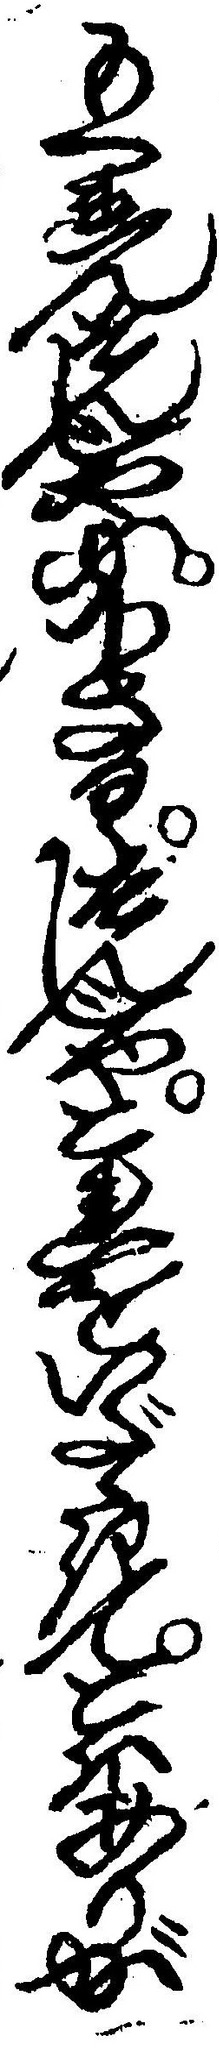もくれんそんじやに。下さるゝ。そんじやこれをいたゞきて。こはありが
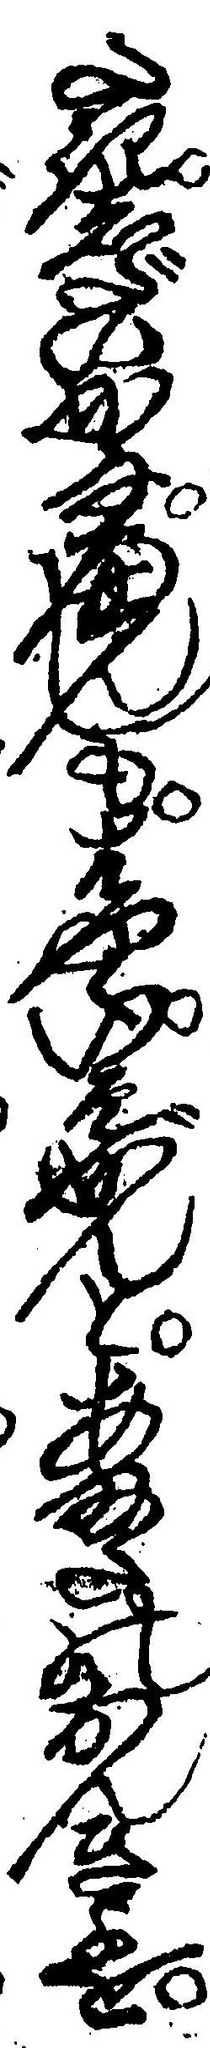たき。しだいかな。へんしも。はやく。いそがんと。あまたのおんきよを。
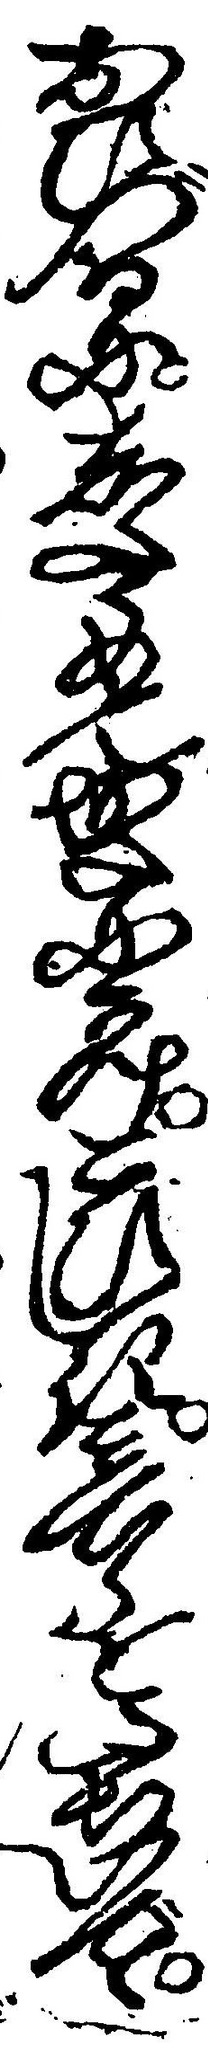おひづるに。したゝめてかたにかけ。こひしき。みてらをたちいでゝ。
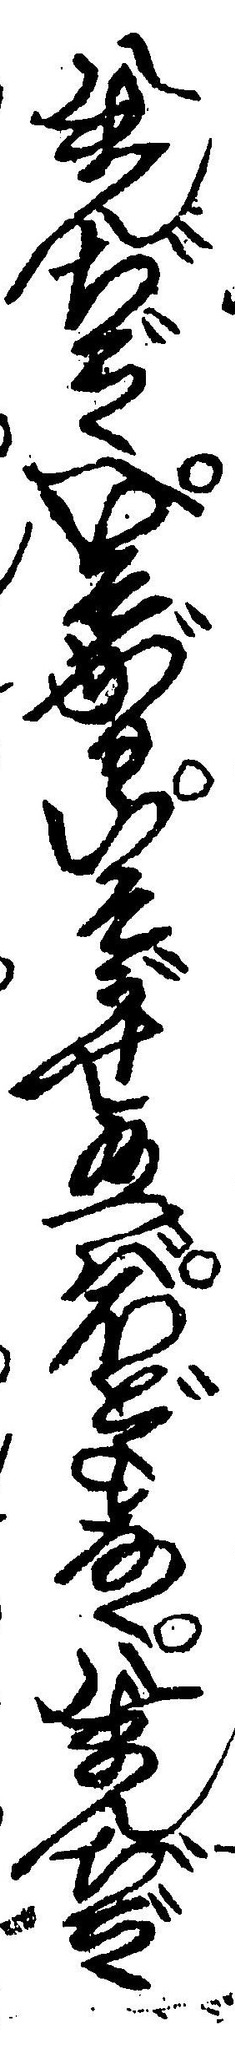八まんぢごくへ。いそがるゝ。いそがせ給へば。ほどもなく。八まんぢごく
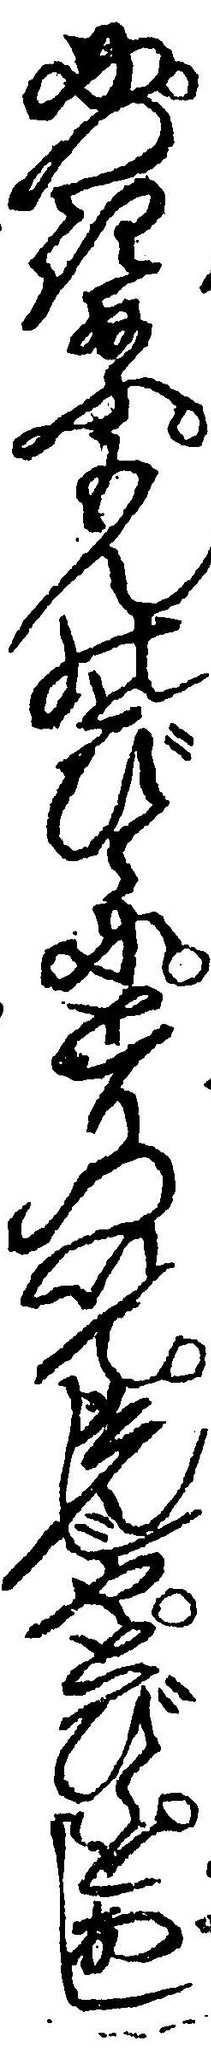に。つき給ふ。もんのとびらに。とりついて。そんじやとびらを。おし
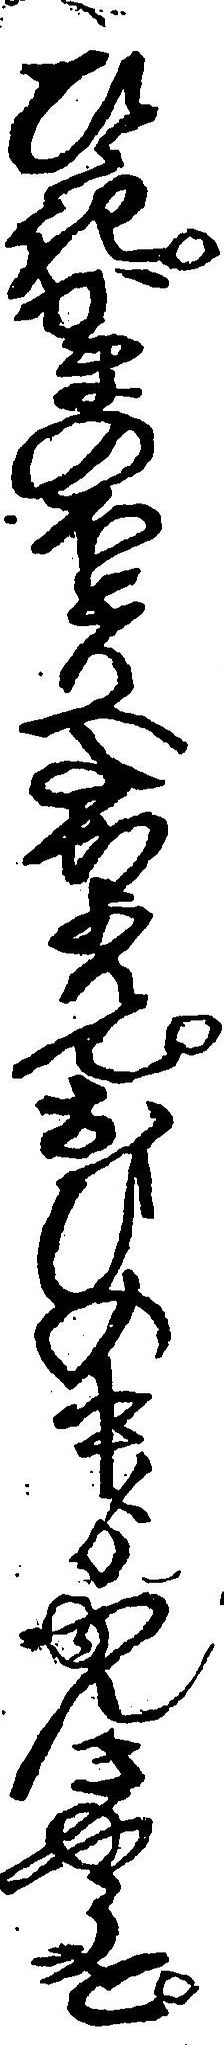ひらき。かまのほとりへたちよりて。おひの中ゟおんきやうを。
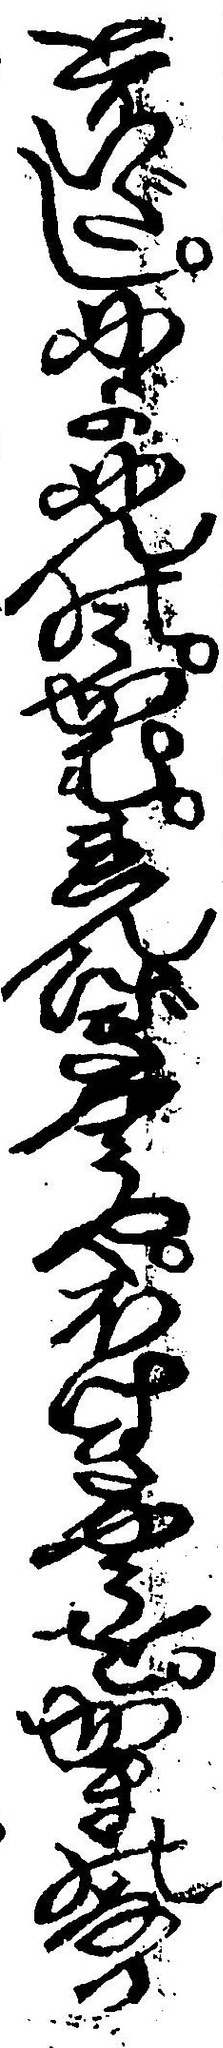とりいだし。によにんの。うかむ。れんげきやうや。ほけきやうを。かまのなか
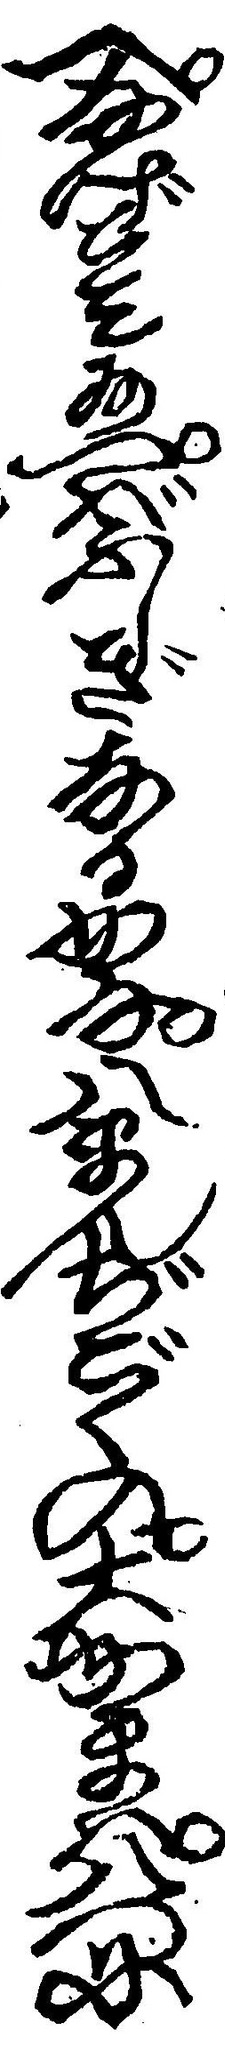へ。なげこみ給へば。ふしぎなるかな。八まんぢごくの。大かまは。八つに
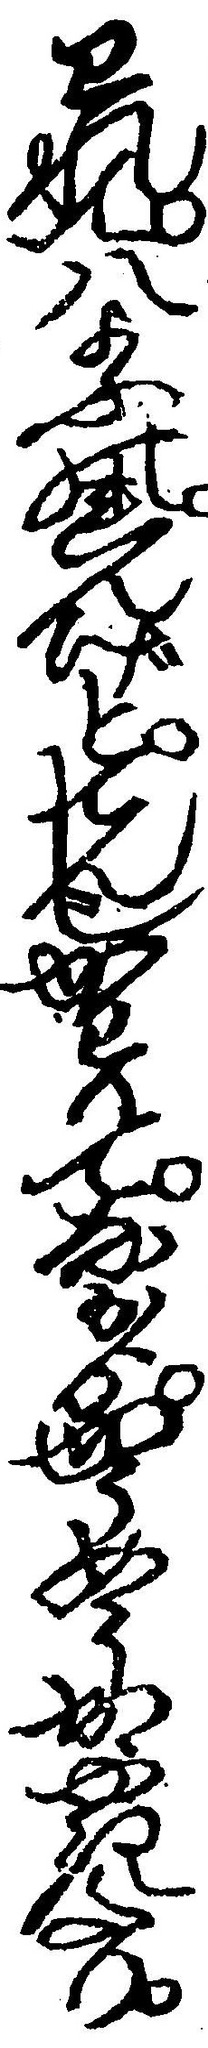われて。八よふの。れんげと。てんじかわりて。なかゟかうめうかゝやきたり。
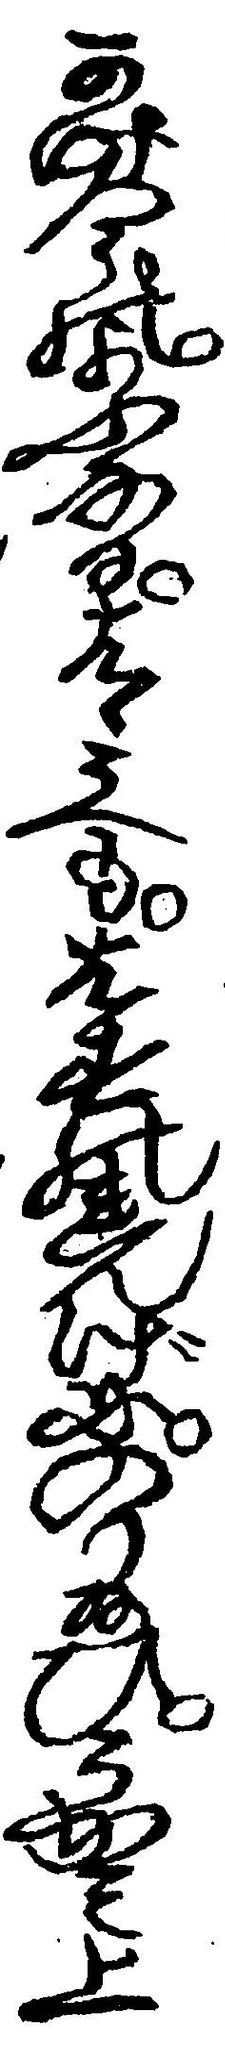かけろうの。よふなる。はゝうへも。はすのれんげに。のり給ひ。うかみ上
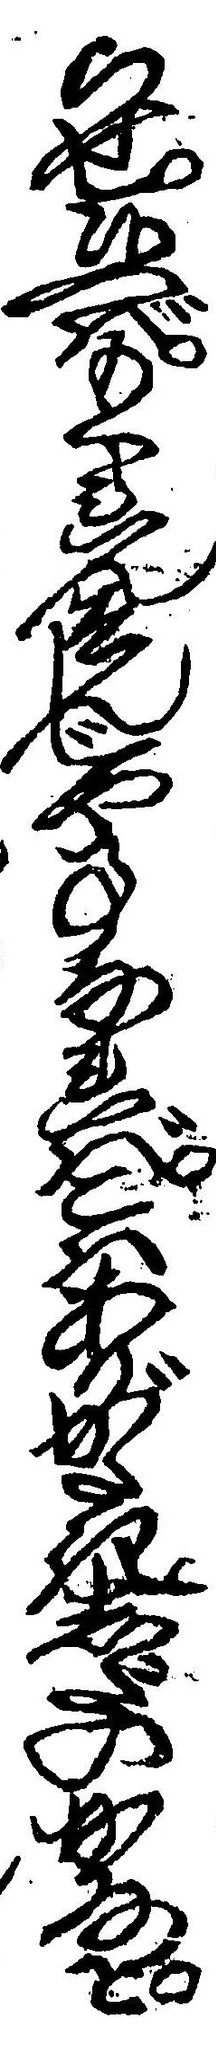らせ。候へば。もくれんそんじや事なれば。こはありがたき。しだいかなと。
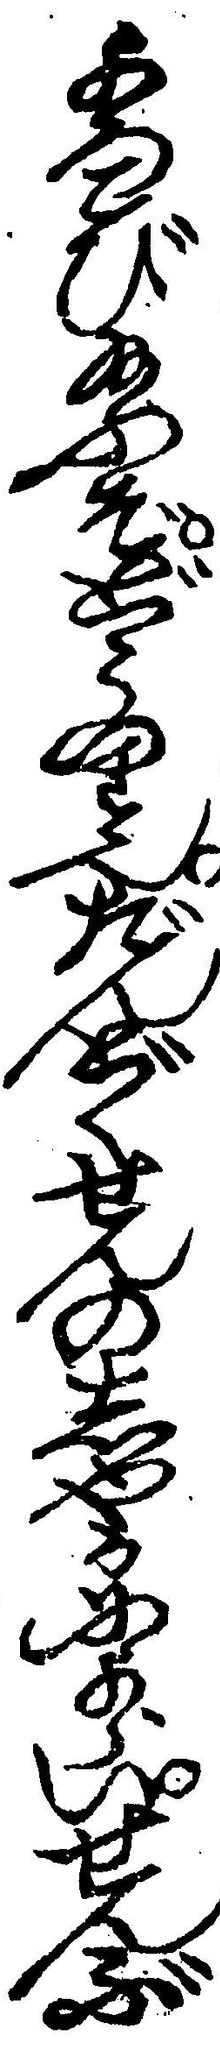よろこび給ふぞ。どうり也。だんどくせんのしやかによらい。せんぶ
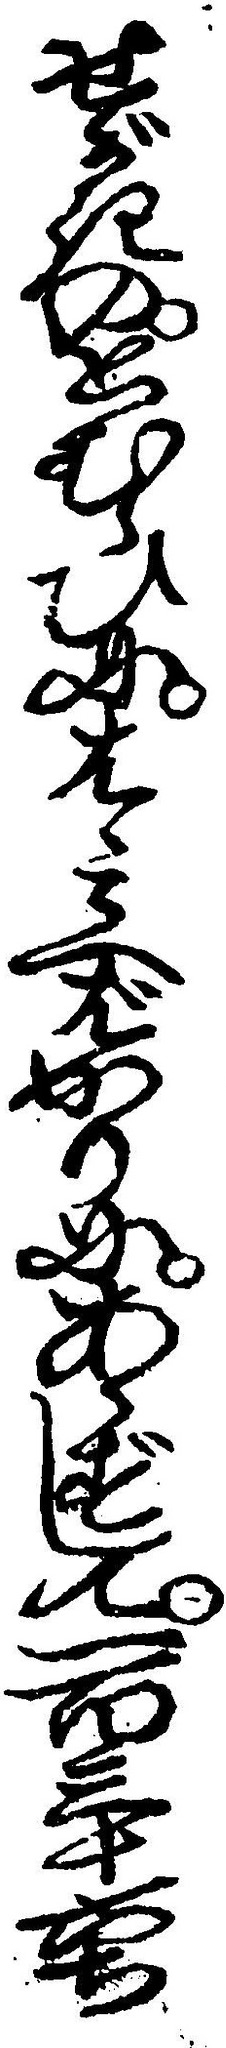せがきの。とむらひに。はゝうへばかりに。あらずして。一百三十六ち
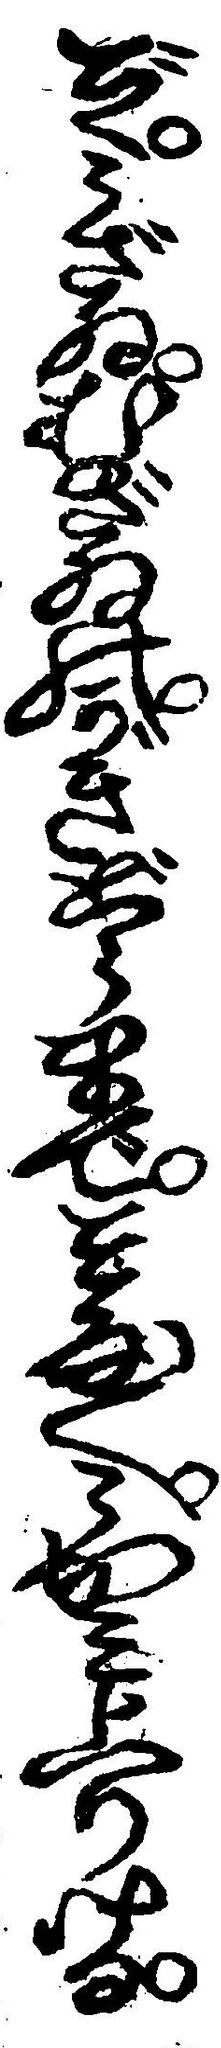ごく。うざゐ。むざゐの。がきどうまで。みな〳〵。うかみ上りける。
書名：目連尊者地獄めくり / 宇留藤太夫正本
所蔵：東京大学総合図書館 General Library in the University of Tokyo, JAPAN
